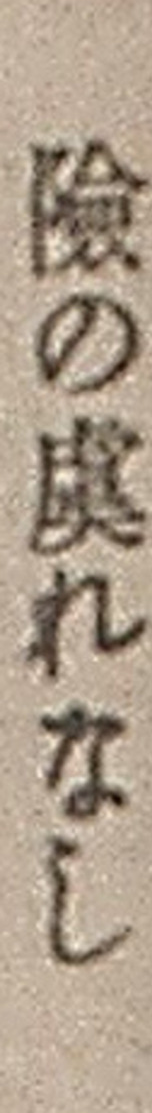険の虞れなし
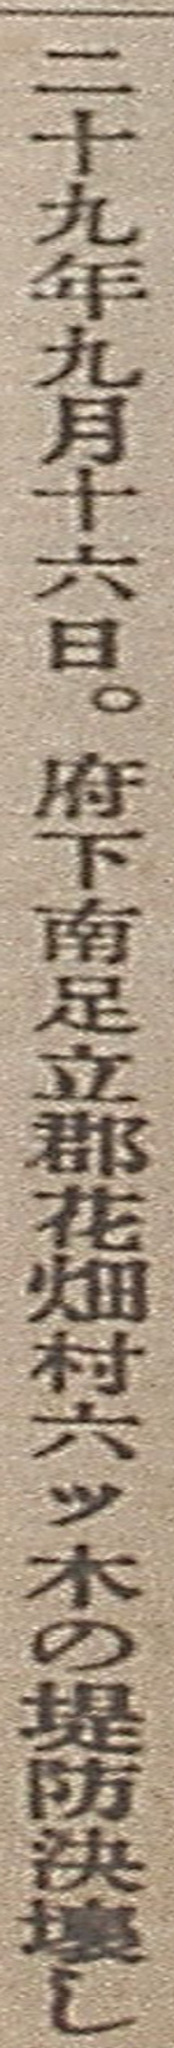二十九年九月十六日。府下南足立郡花畑村六ツ木の堤防決壊し

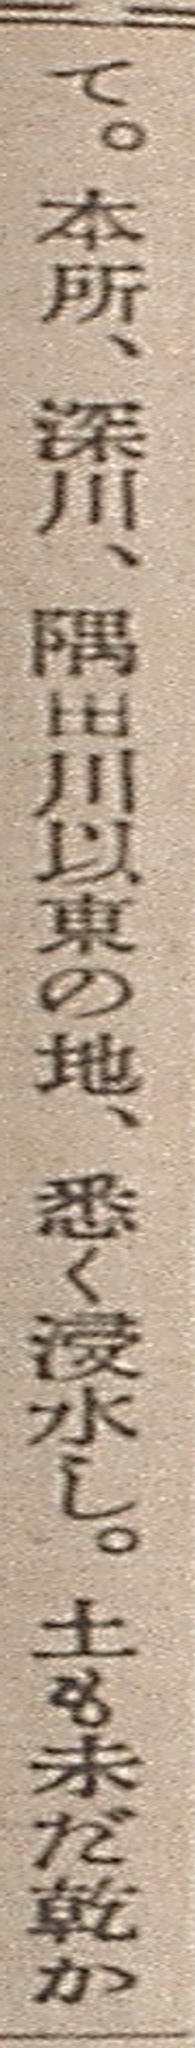て。本所、深川、隅田川以東の地、悉く浸水し。土も未だ乾か
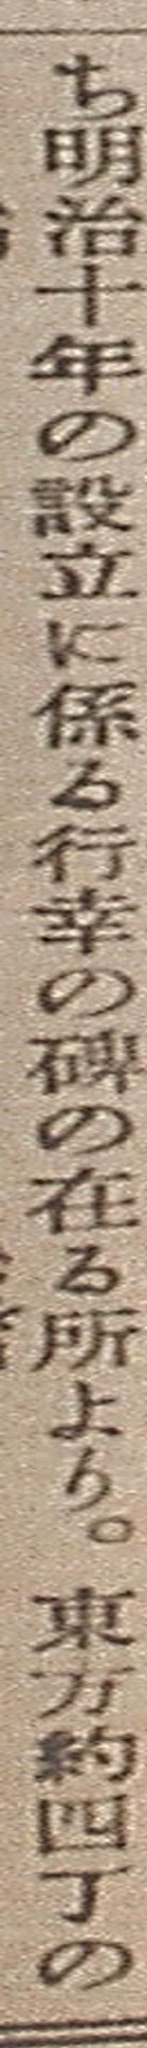ち明治十年の設立に係る行幸の碑の在る所より。東方約四丁の
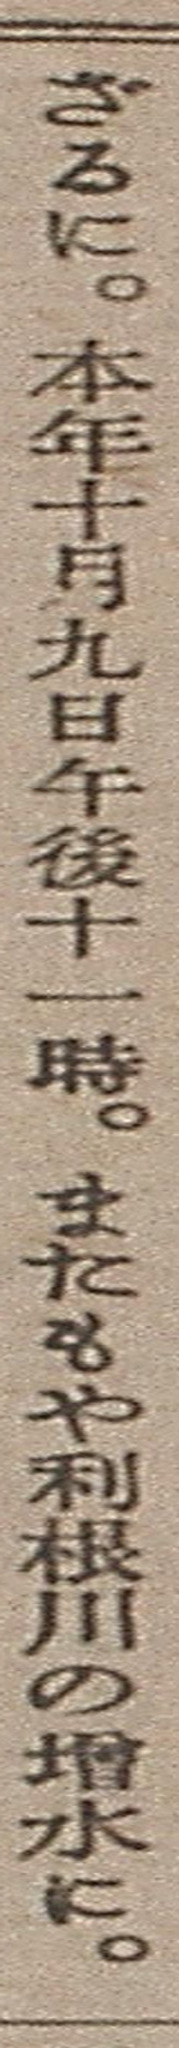ざるに。本年十月九日午後十一時。またもや利根川の増水に。
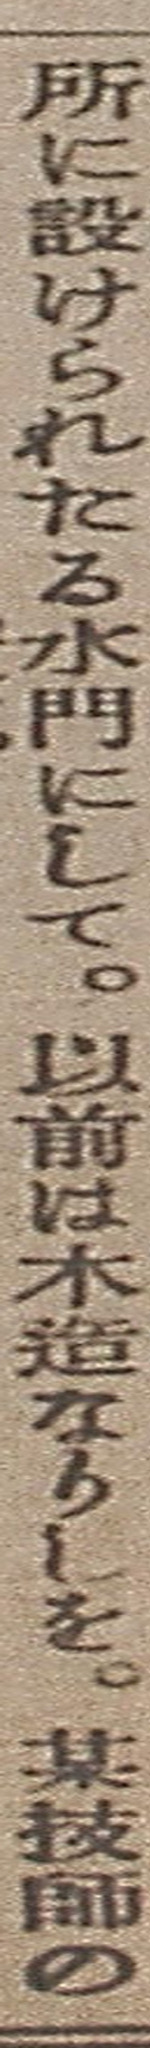所に設けられたる水門にして。以前は木造なりしを。某技師の
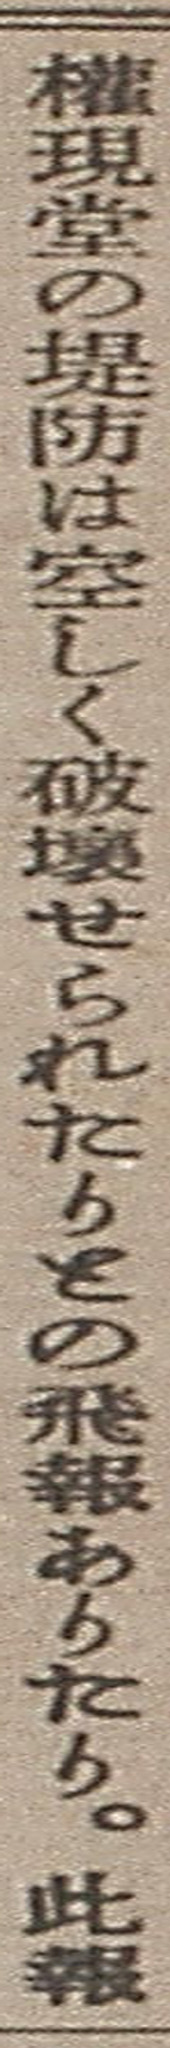権現堂の堤防は空しく破壊せられたりとの飛報ありたり。此報
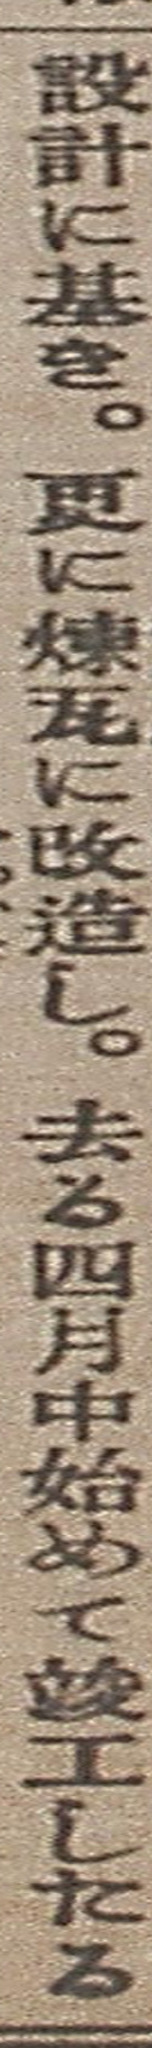設計に基き。更に煉瓦に改造し。去る四月中始めて竣工したる
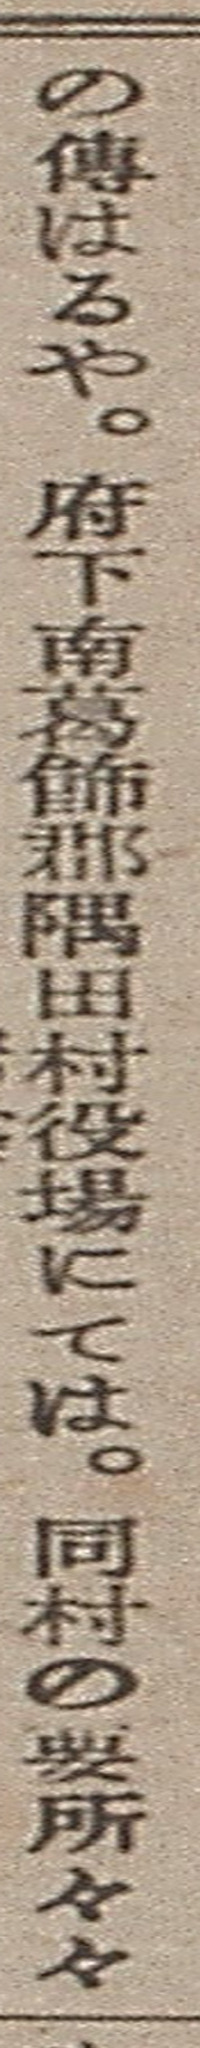の伝はるや。府下南葛飾郡隅田村役場にては。同村の要所々々
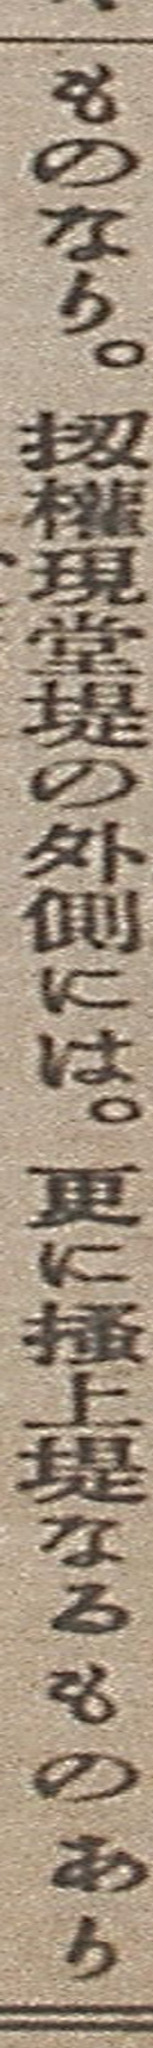ものなり。扨権現堂堤の外側には。更に掻上堤なるものあり
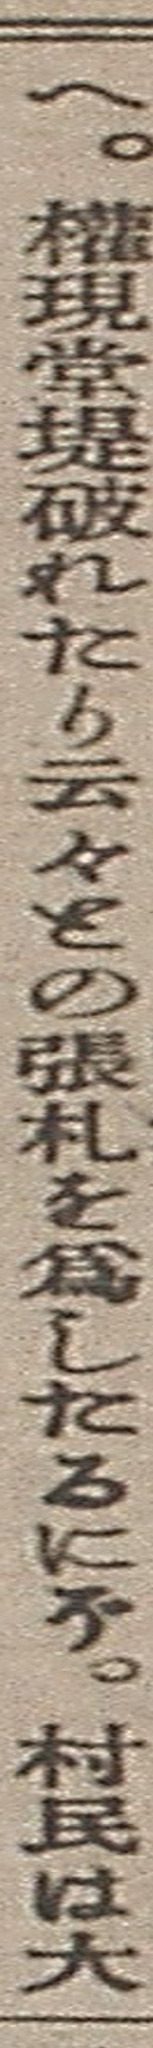へ。権現堂堤破れたり云々との張札を為したるにぞ。村民は大
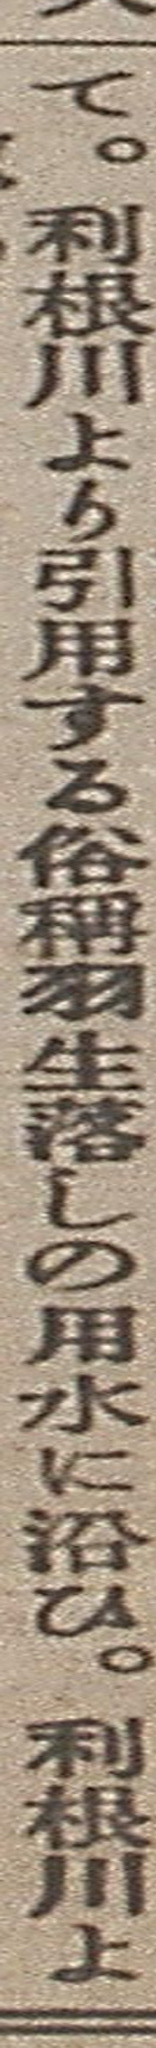て。利根川より引用する俗称羽生落しの用水に沿ひ。利根川よ
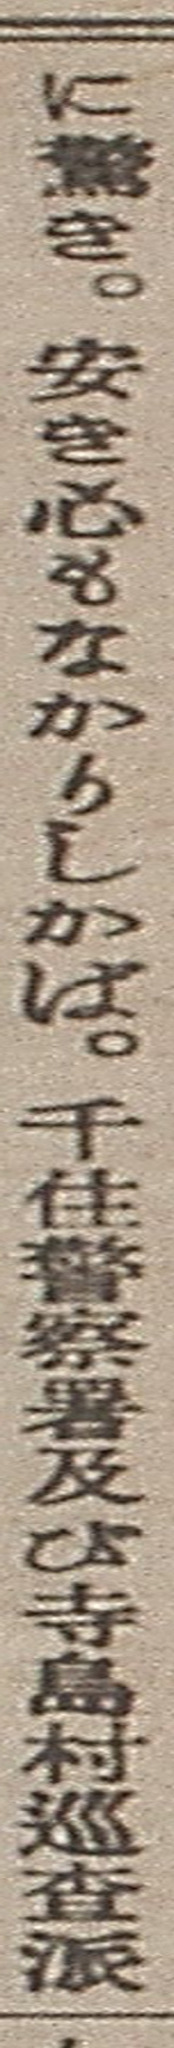に驚き。安き心もなかりしかば。千住警察署及び寺島村巡査派
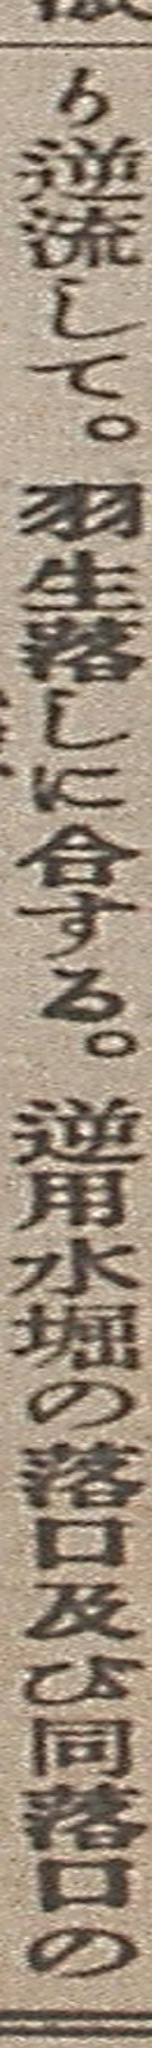り逆流して。羽生落しに合する。逆用水堀の落口及び同落口の
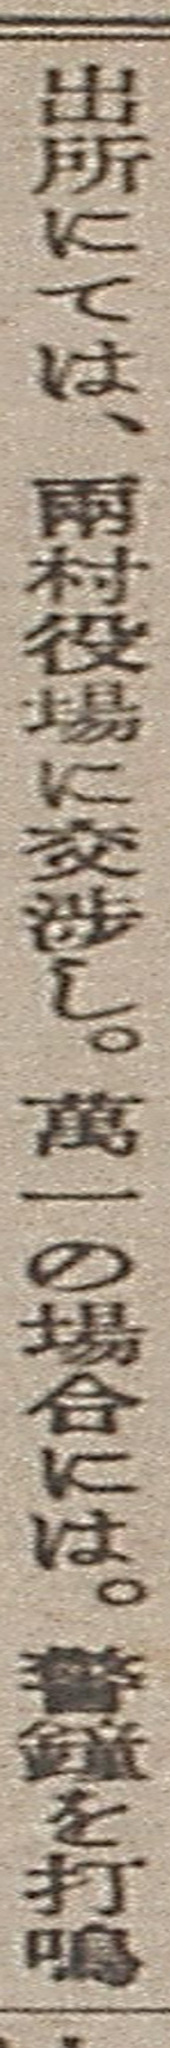出所にては、両村役場に交渉し。万一の場合には。警鐘を打鳴
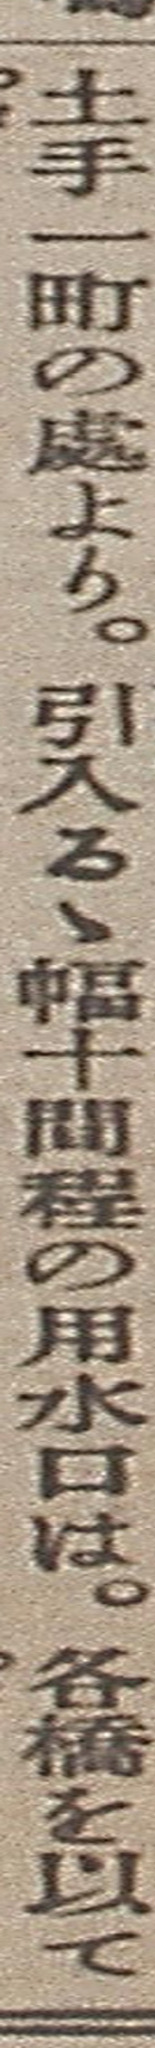土手一町の処より。引入るゝ幅十間程の用水口は。各橋を以て
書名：風俗畫報臨時増刊第百九十九號　明治三十二年十月各地災害圖會（前編之續）
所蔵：東京大学地震研究所図書室 Earthquake Research Institute Library, The University of Tokyo, JAPAN
